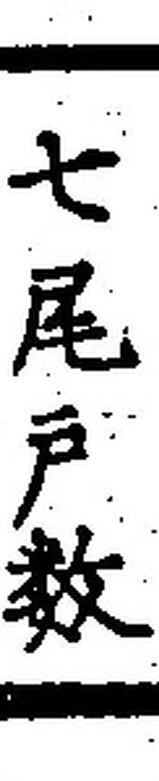七尾戸数
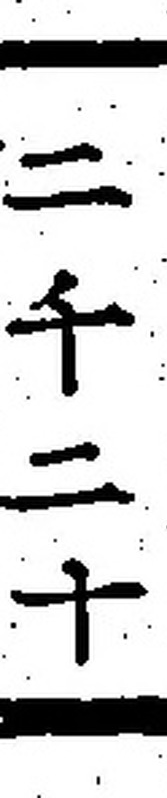二千二十
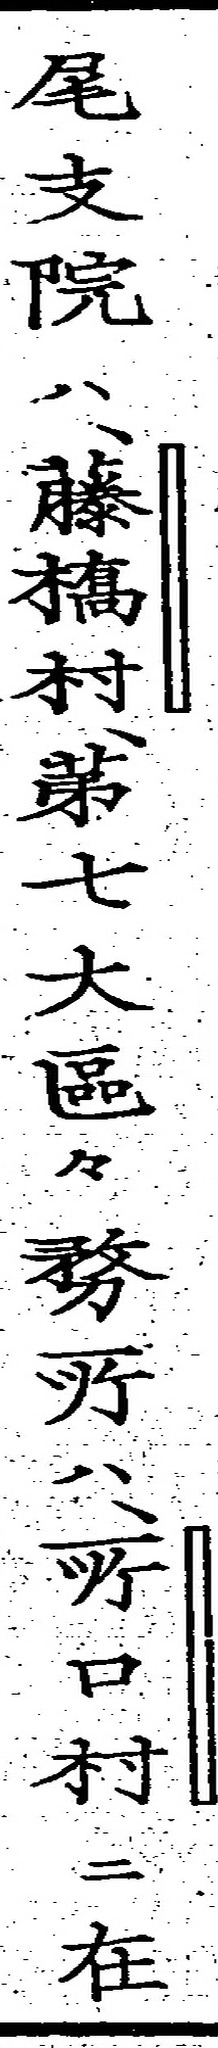尾支院ハ、藤橋村、第七大区々務所ハ、所口村ニ在
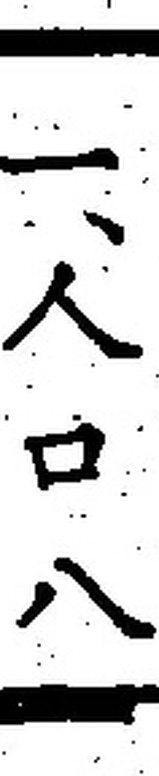一、人口八
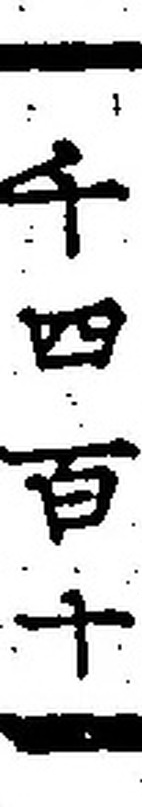千四百十
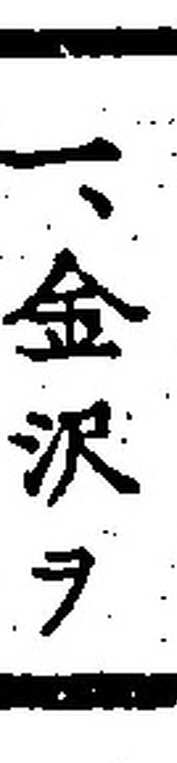一、金沢ヲ
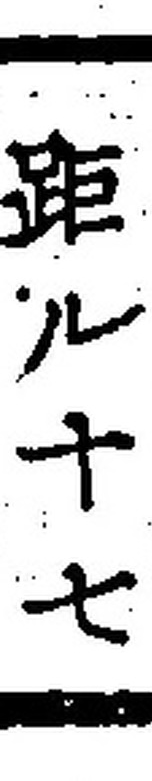距ル十七
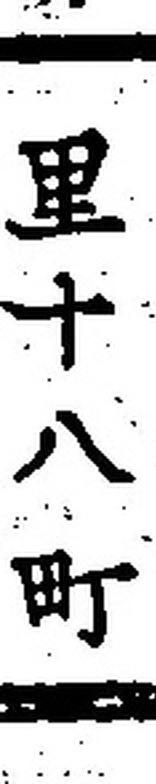里十八町
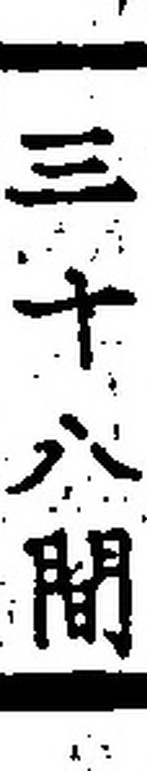三十八間
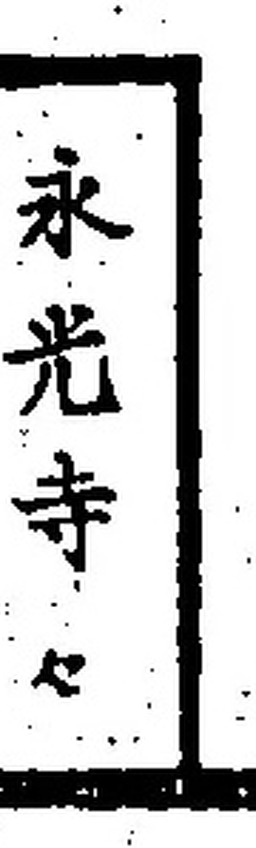永光寺々
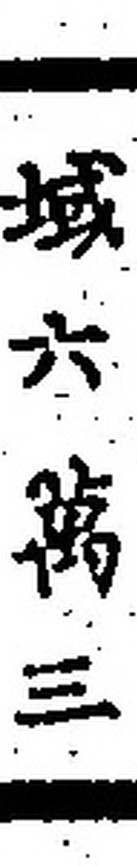域六万三
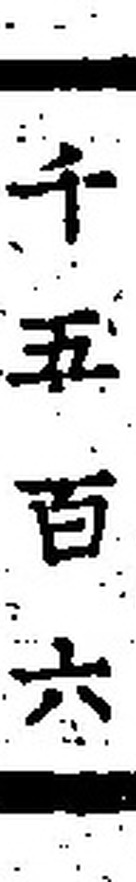千五百六
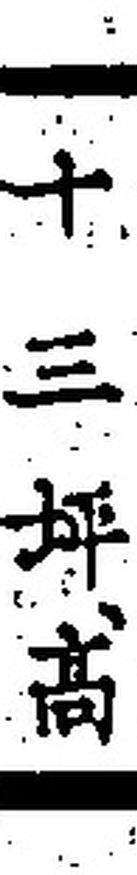十三坪、高
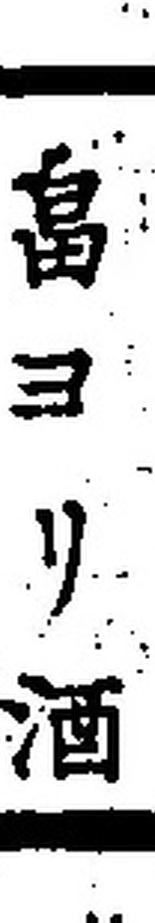畠ヨリ酒
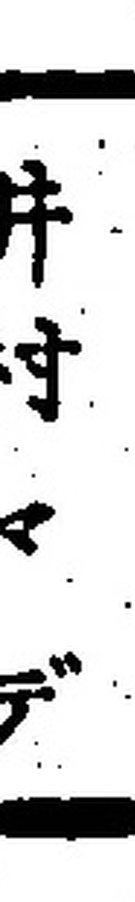井村マデ
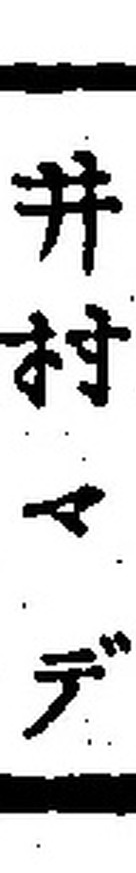井村マデ
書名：能登地誌略
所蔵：国立国会図書館 National Diet Library, JAPAN
